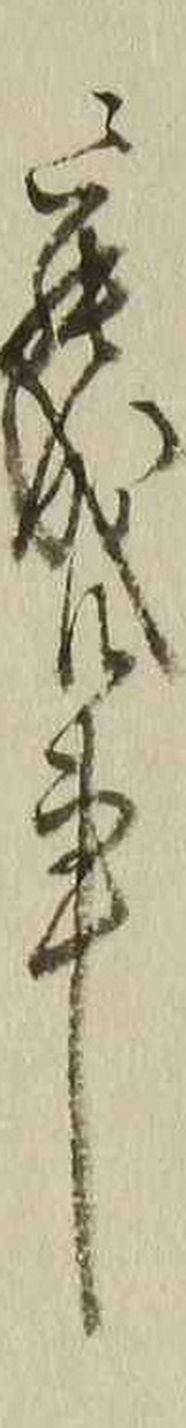ニ罷成候事
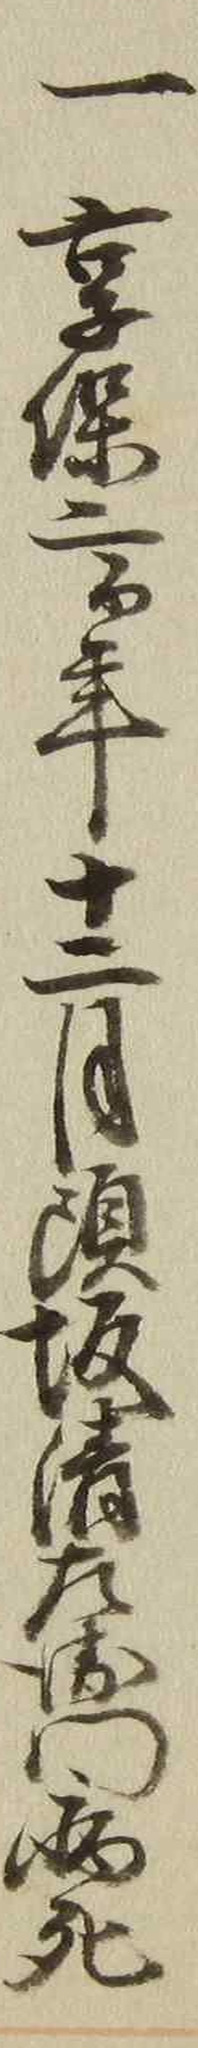一享保ニ酉年十二月坂清左衛門病死
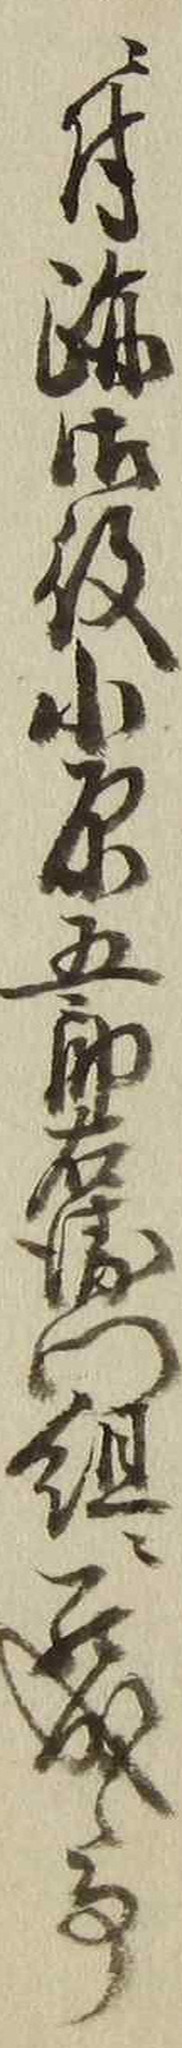ニ付跡御役小原五郎右衛門組ニ罷成候事
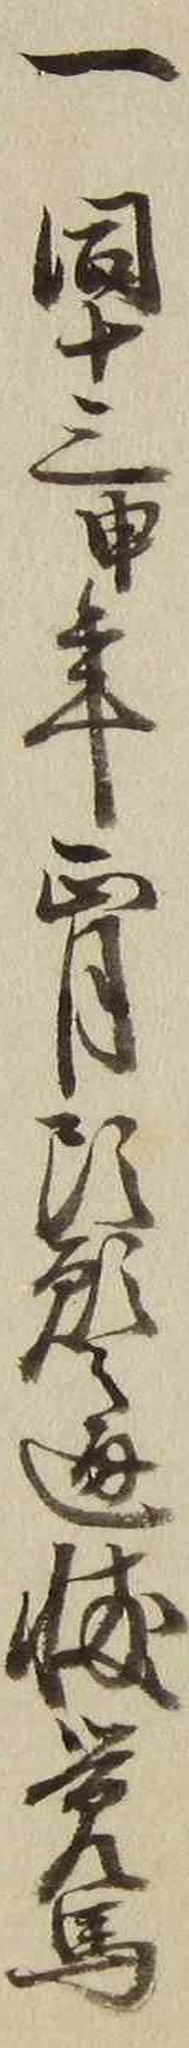一同十三申年正月頭願之通忰覚馬
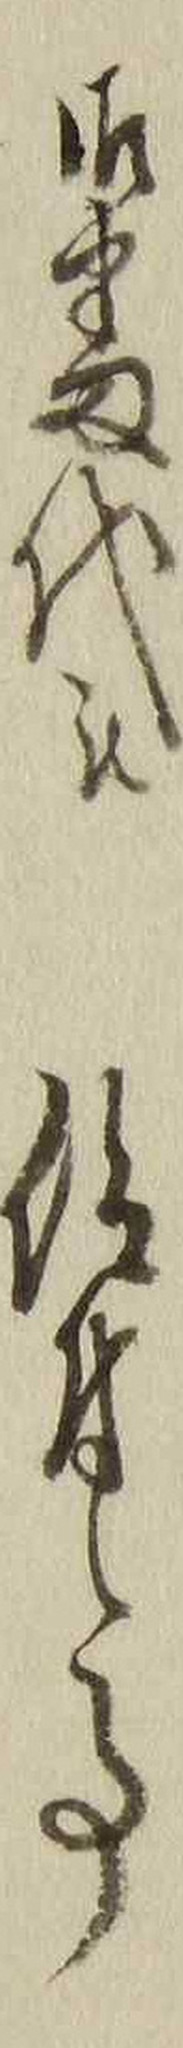御番代被仰付候事
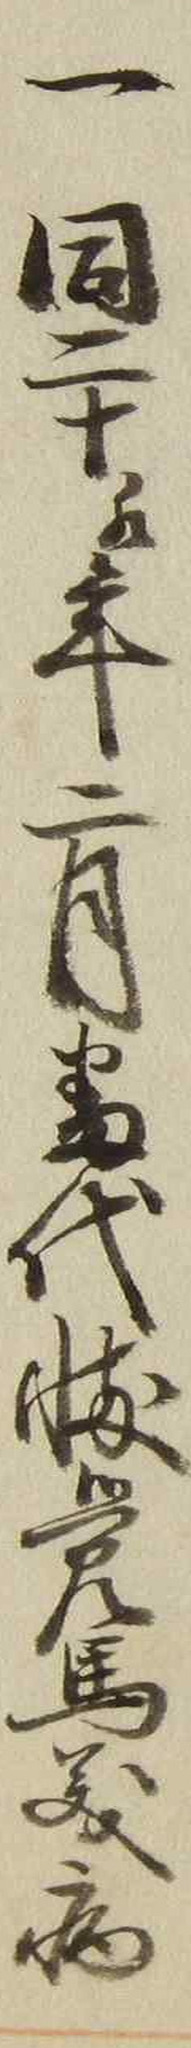一同二十卯年二月番代忰覚馬義病
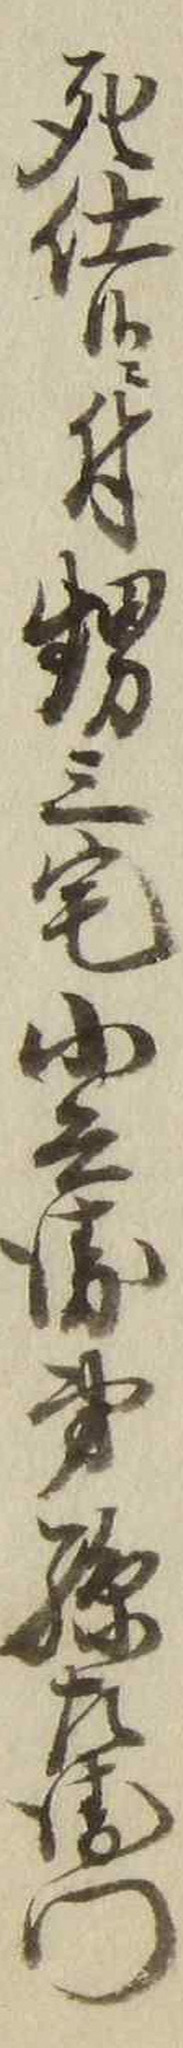死仕候ニ付甥三宅小兵衛弟孫左衛門
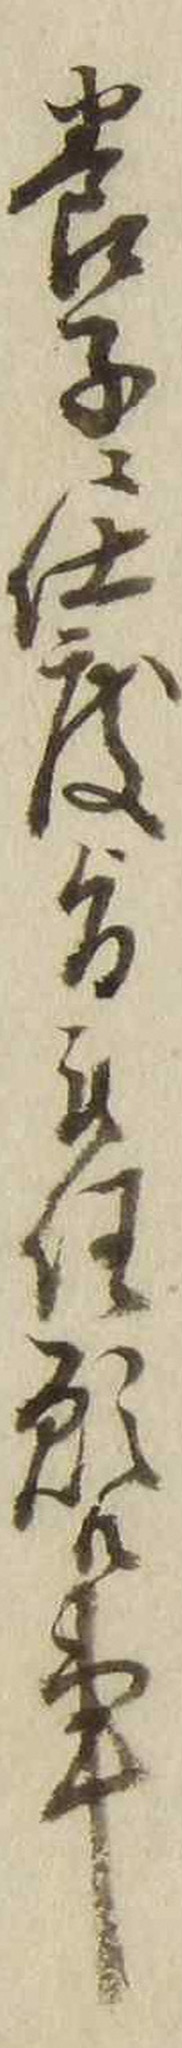養子ニ仕度旨被任願候事

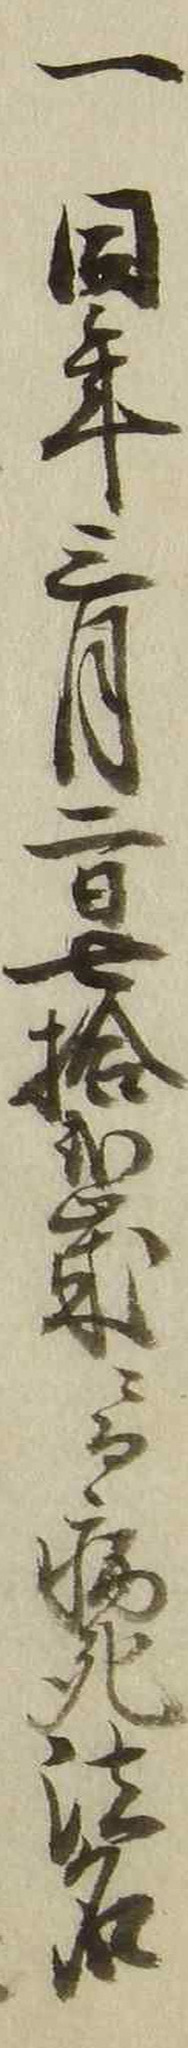一同年三月二日七拾弐歳ニ而病死法名
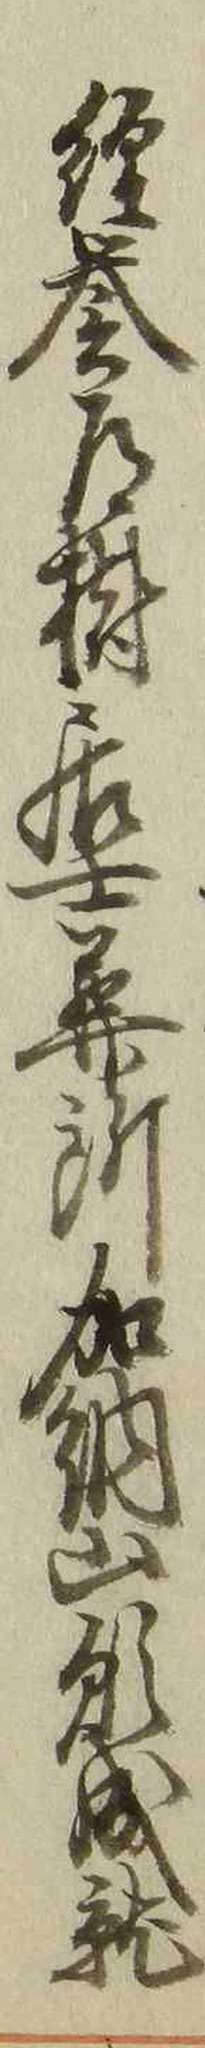経誉道樹居士葬所加納山願成就
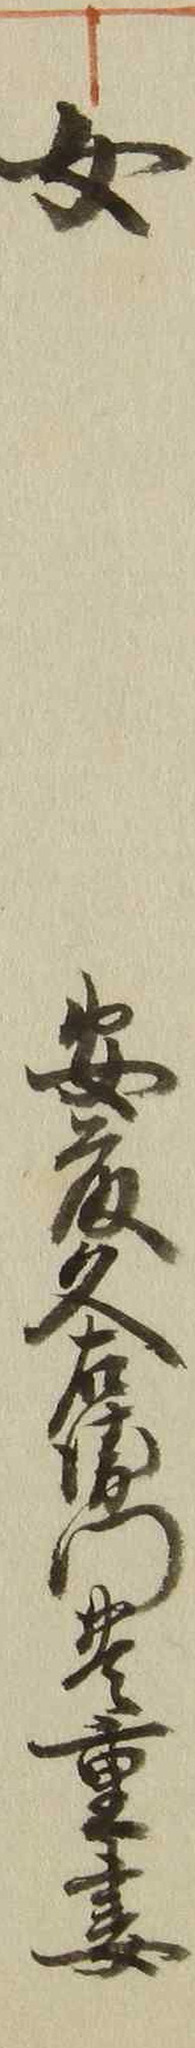女安藤久右衛門豊重妻
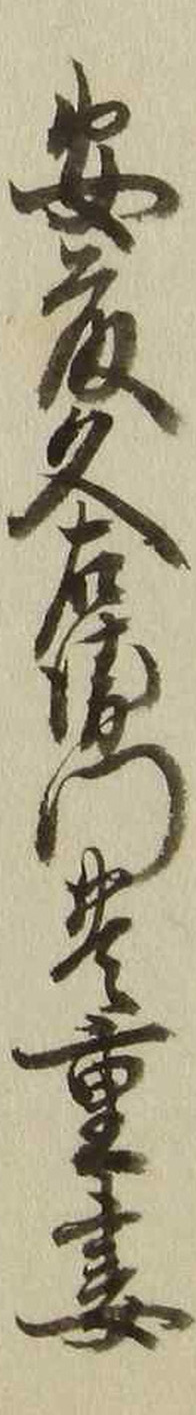女安藤久右衛門豊重妻
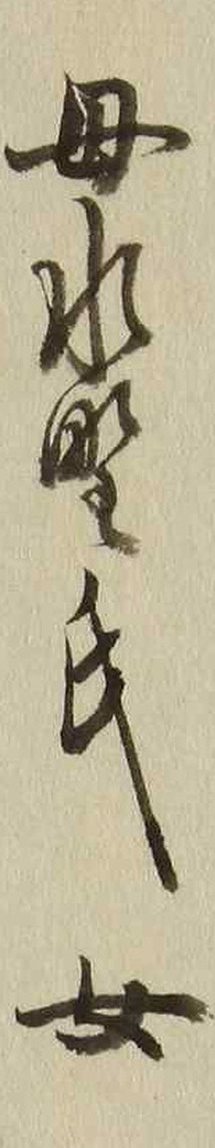母水野氏女
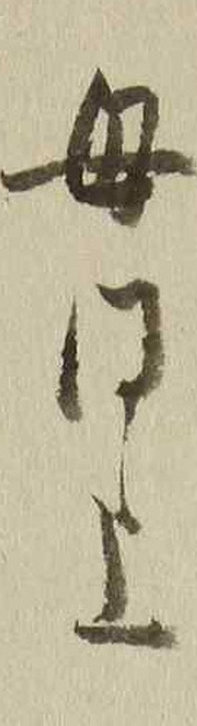母同上
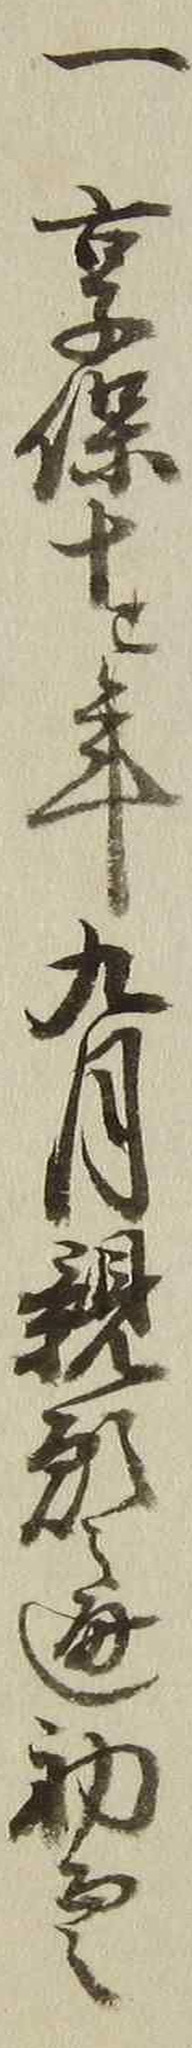一享保十巳年九月親願之通初而之
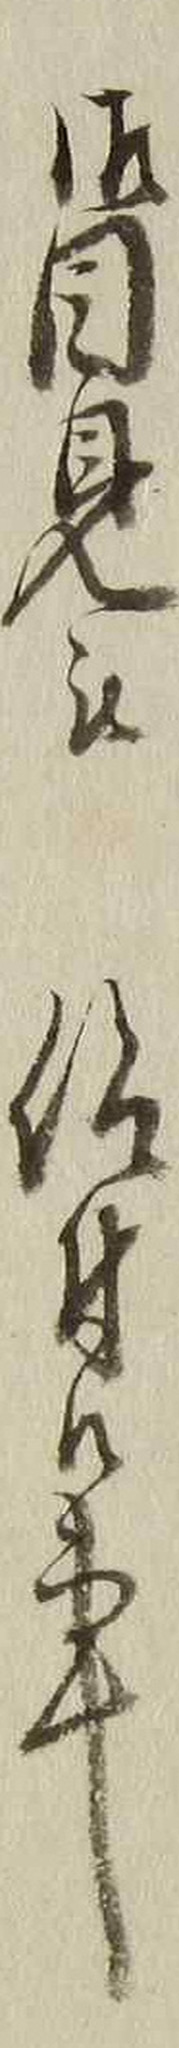御目見被仰付候事
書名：諸士系譜　巻之53　に之部4
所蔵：会津若松市立会津図書館
